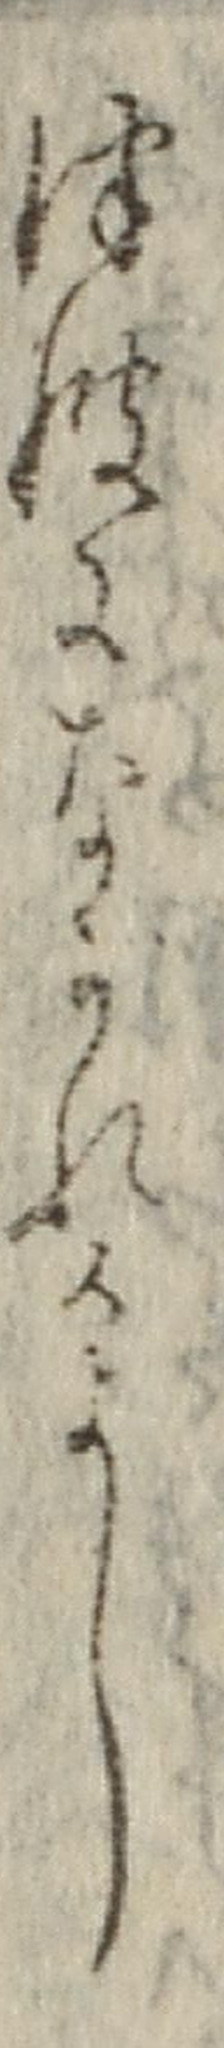津波になかれ候よし
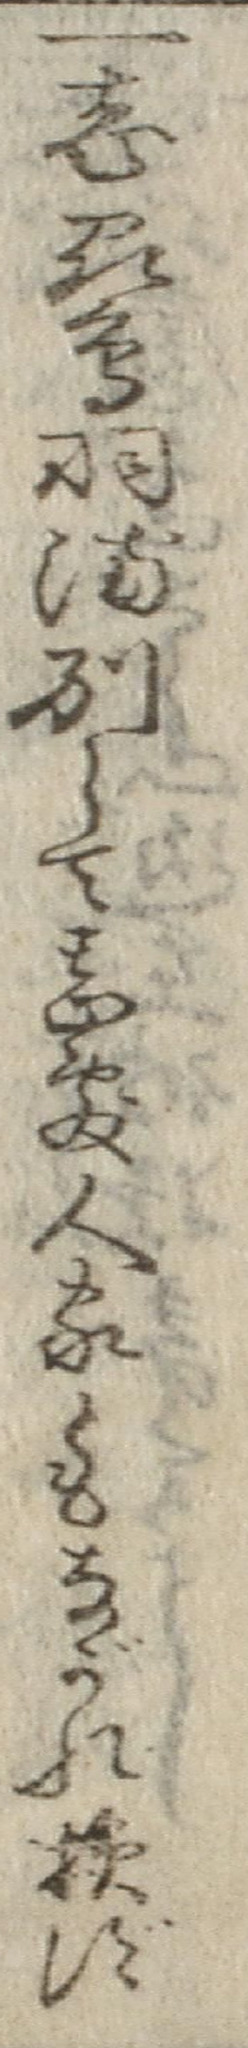一志摩鳥羽浦別して甚敷人家ともながれ損ず
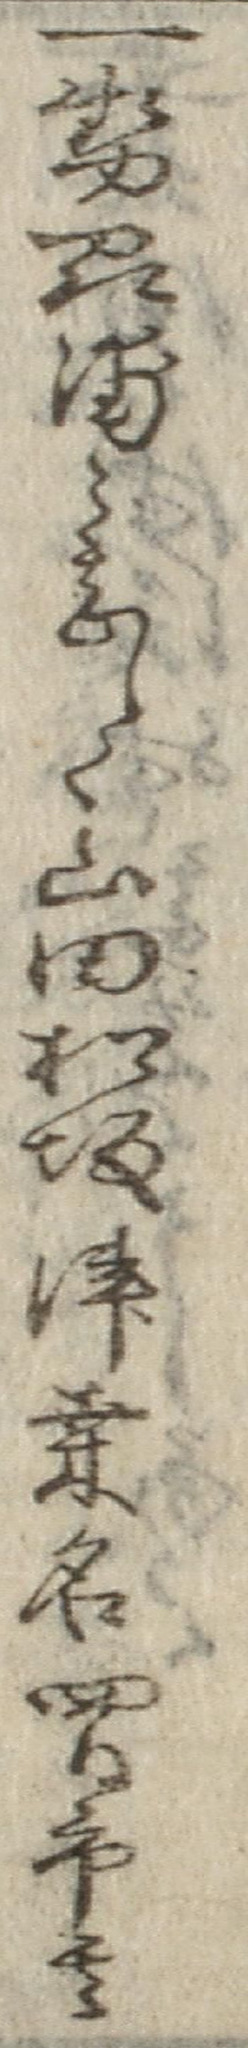一勢州浦〻甚しく山田松坂津桑名四日市其
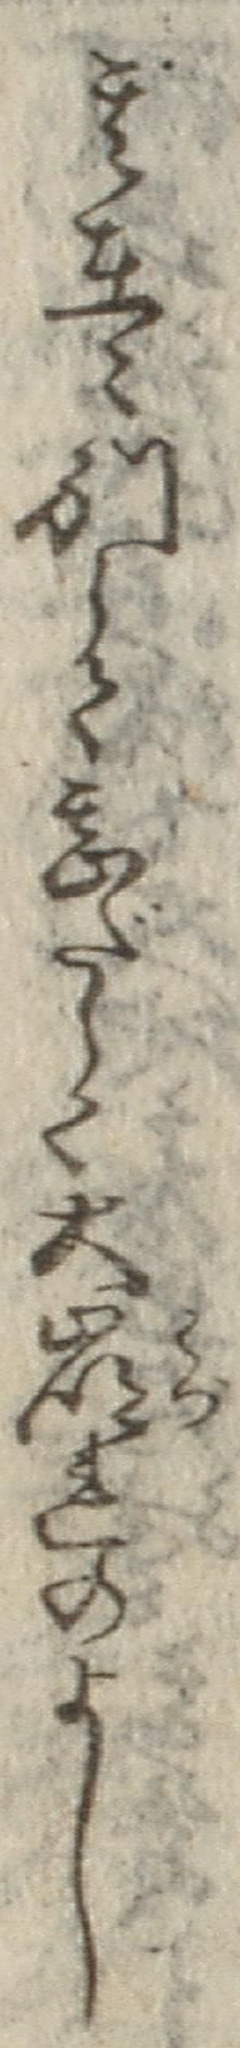其在〻別して甚だしく大崩れのよし
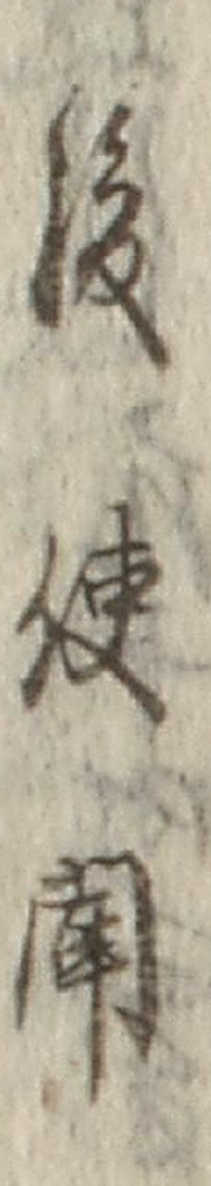後使聞
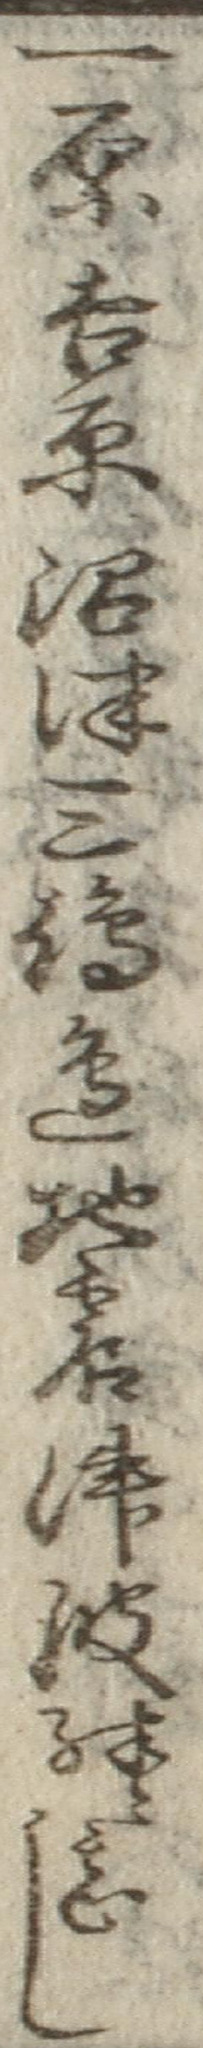一原吉原沼津三嶋辺地震津波殊ニ甚し
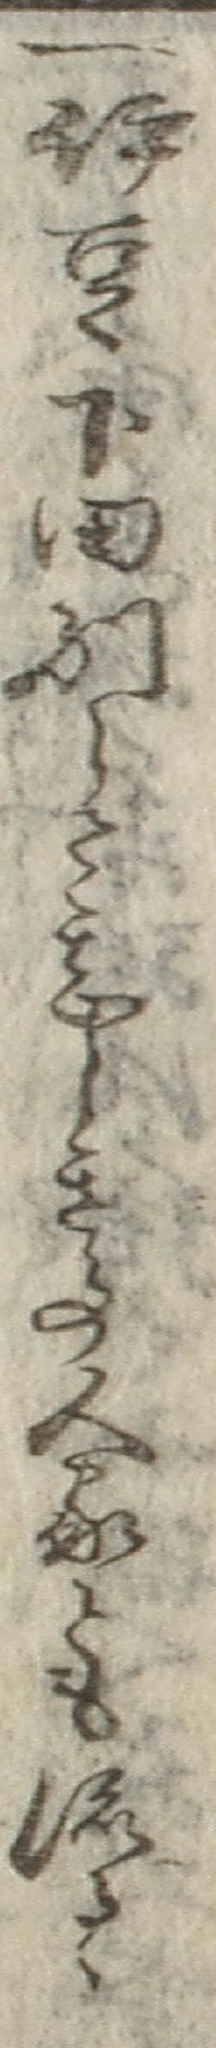一伊豆下田別して甚しき事人家とも流るゝ
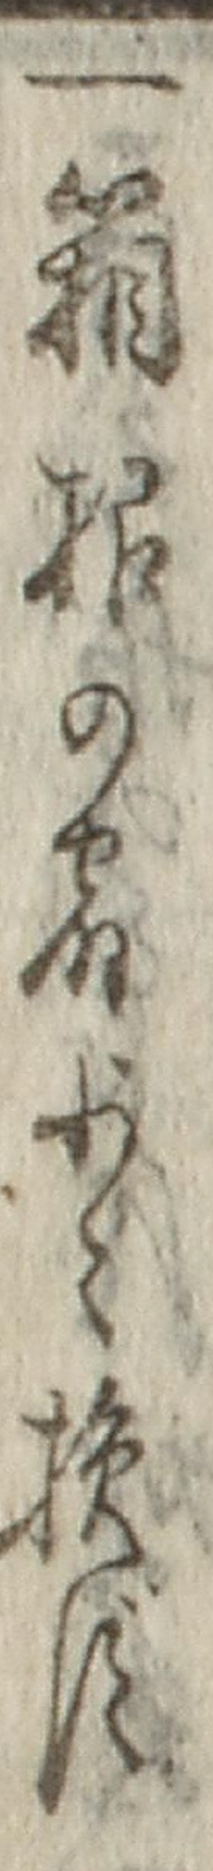一箱根の宿少〻損ず
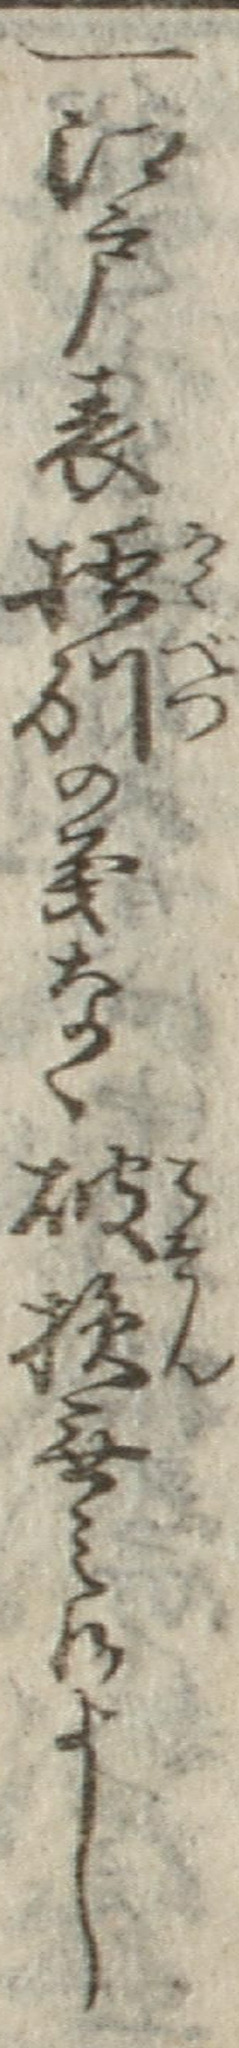一江戸表格別の義なく破損無之候よし

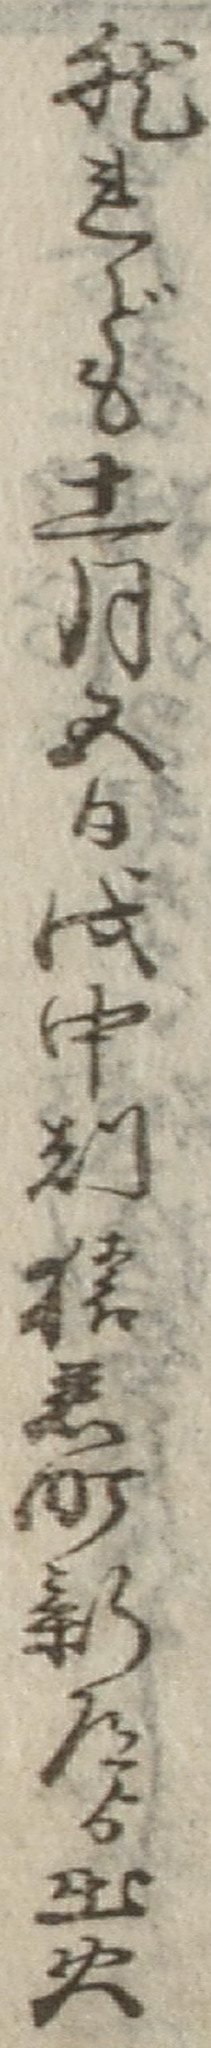然れども十一月五日戌中刻猿若町新道ゟ出火
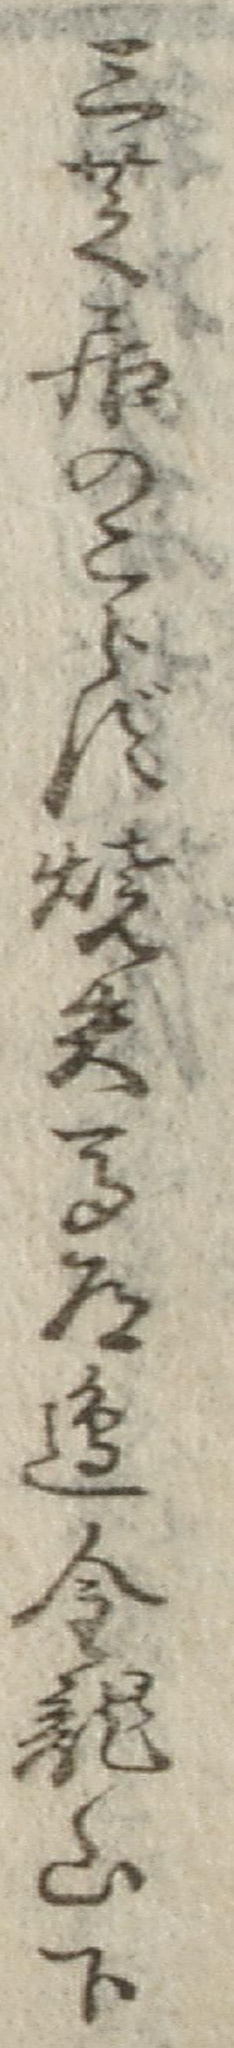三芝居のこらず焼失馬道辺金龍山下
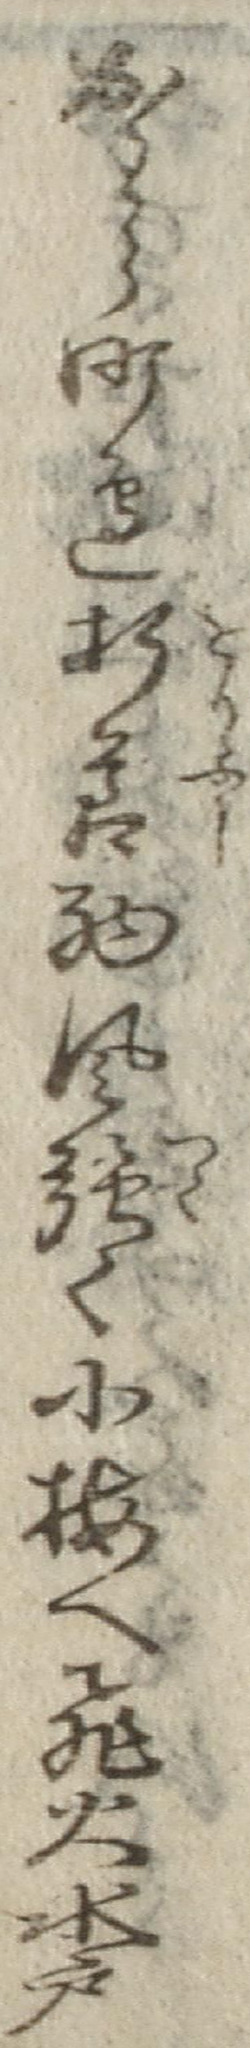かわら町辺折節西風強く小梅へ飛火水戸
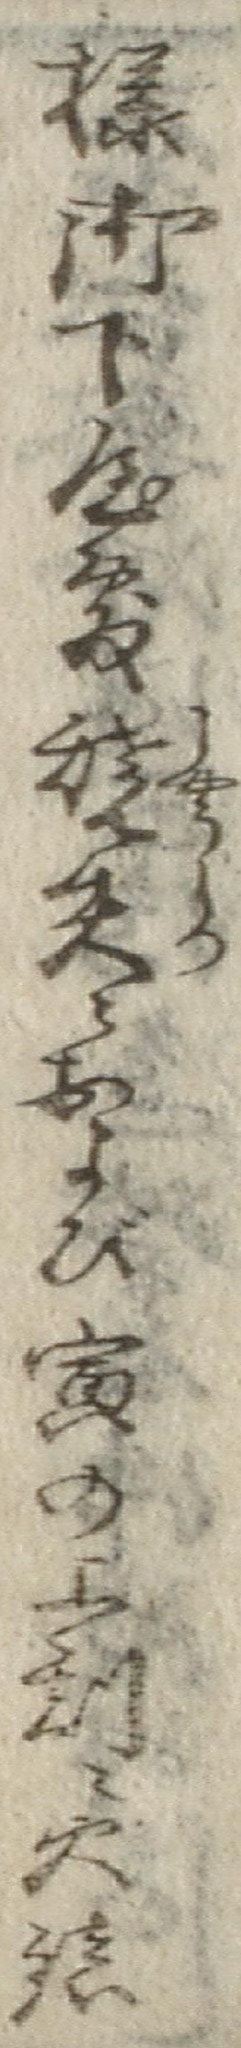様御下屋敷焼失ニおよび寅の上刻ニ火慎
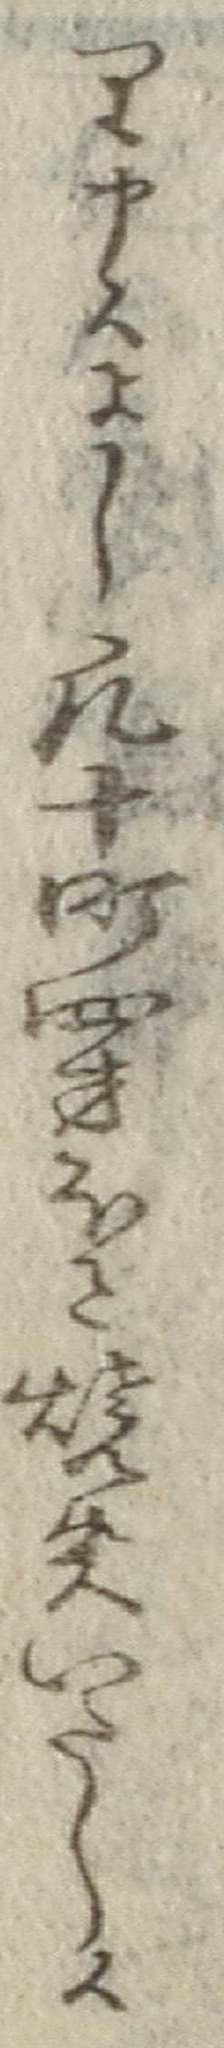り申候よし凡十町四方ほと焼失いたし候
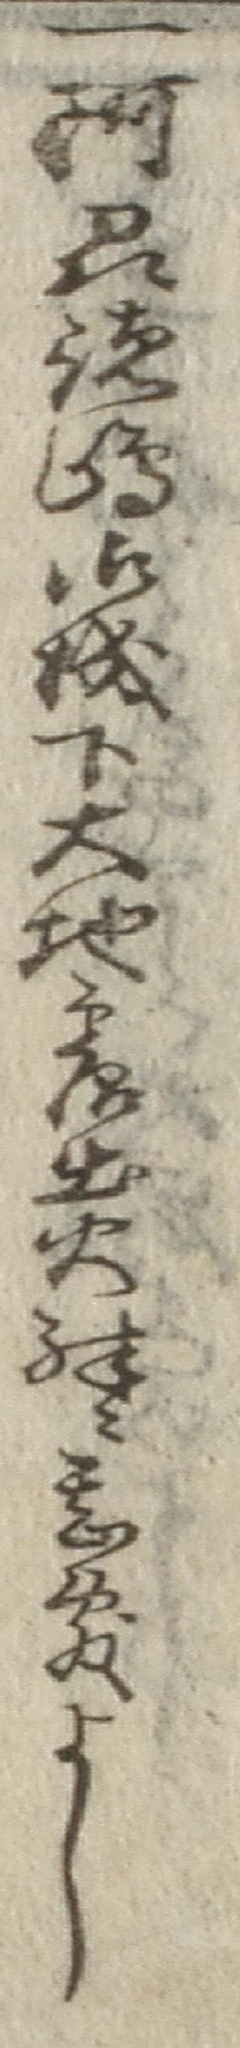一阿州徳島御城下大地震出火殊ニ甚敷よし
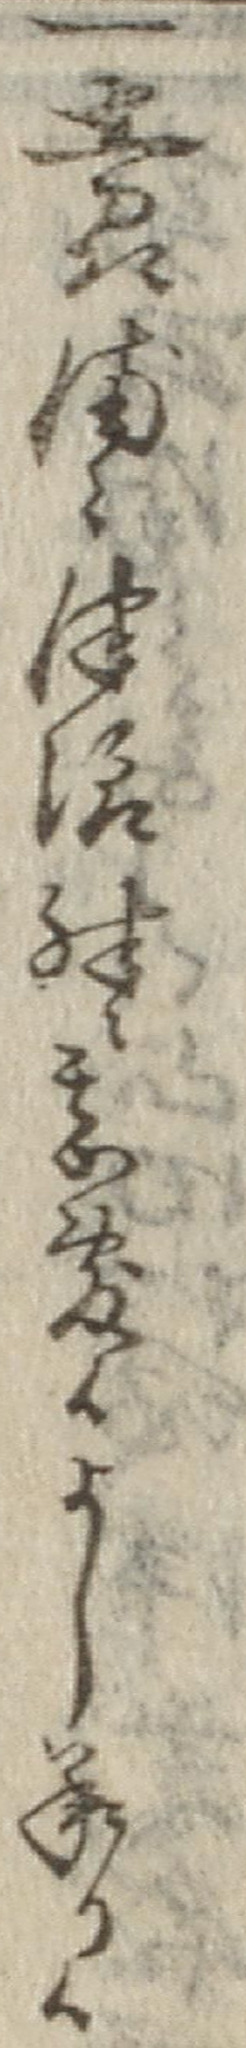一土州浦津浪殊ニ甚敷候よし承り候
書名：世直り艸紙
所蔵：東京大学地震研究所図書室 Earthquake Research Institute Library, The University of Tokyo, JAPAN
